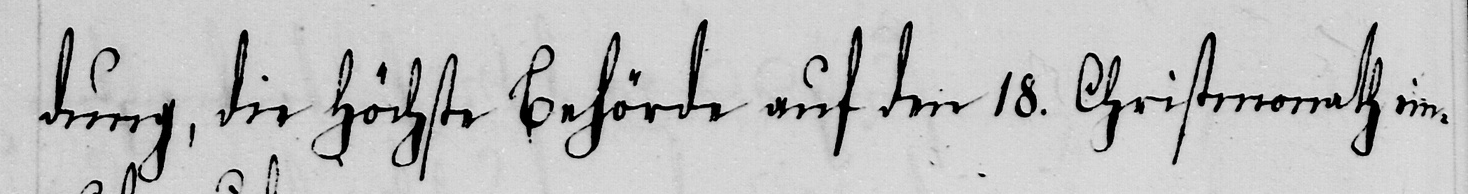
dung, die Höchste Behörde auf den 18. Christmonath ei¬
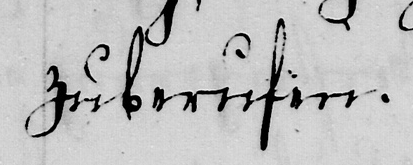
nzuberufen.
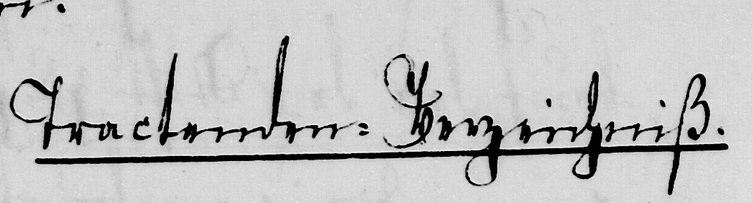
Tractanden-Verzeichniß.
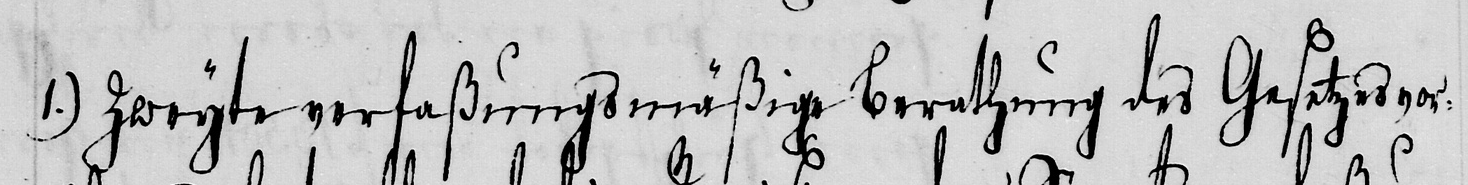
1.) Zweyte verfaßungsmäßige Berathung des Gesetzesvor¬
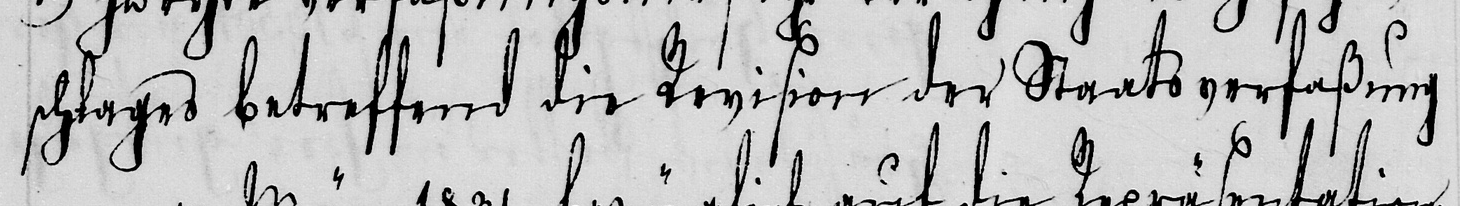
schlages betreffend die Revision der Staatsverfaßung
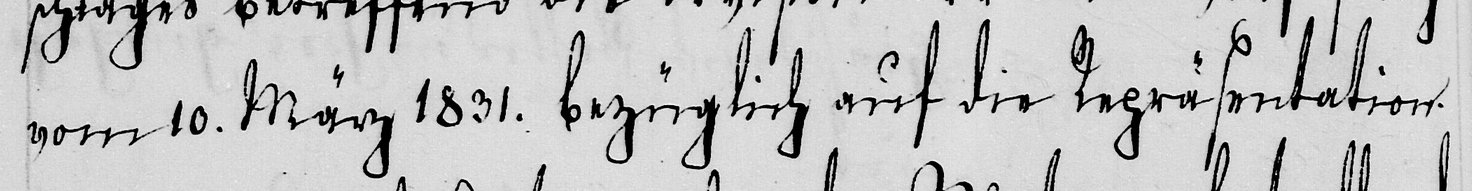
vom 10. März 1831. bezüglich auf die Repräsentation.
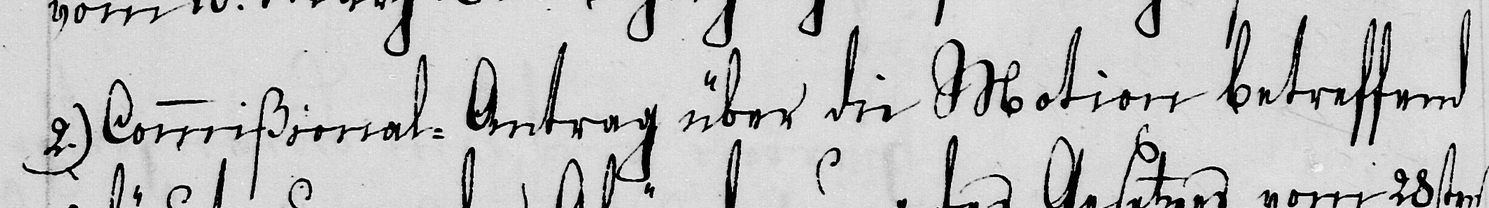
2.) Commißional-Antrag über die Motion betreffend
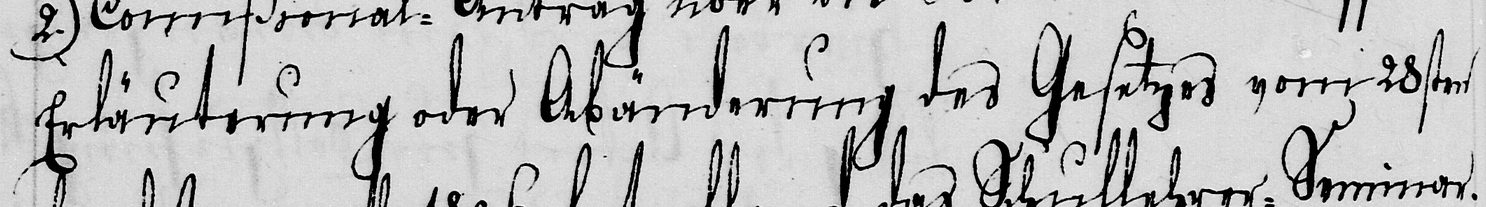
Erläuterung oder Abänderung des Gesetzes vom 28sten
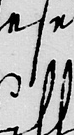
nd:
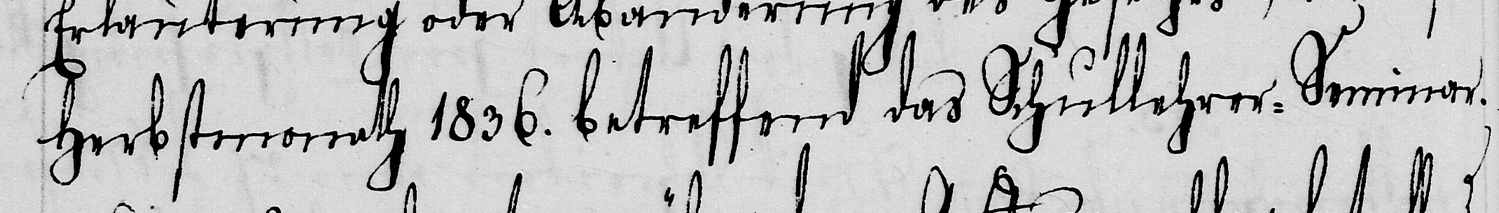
Herbstmonath 1836. betreffend das Schullehrer-Seminar.
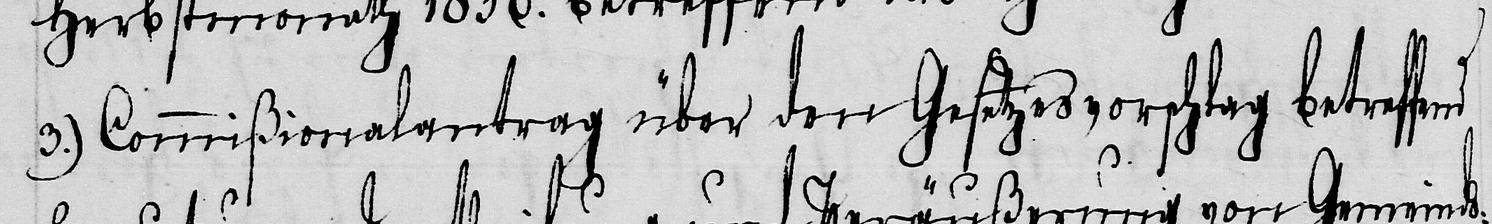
3.) Commißionalantrag über den Gesetzesvorschlag betreffe¬
